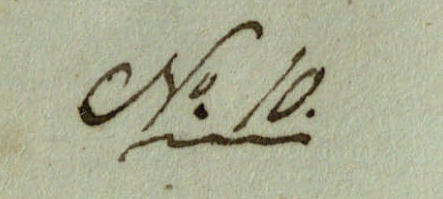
Nº 10.
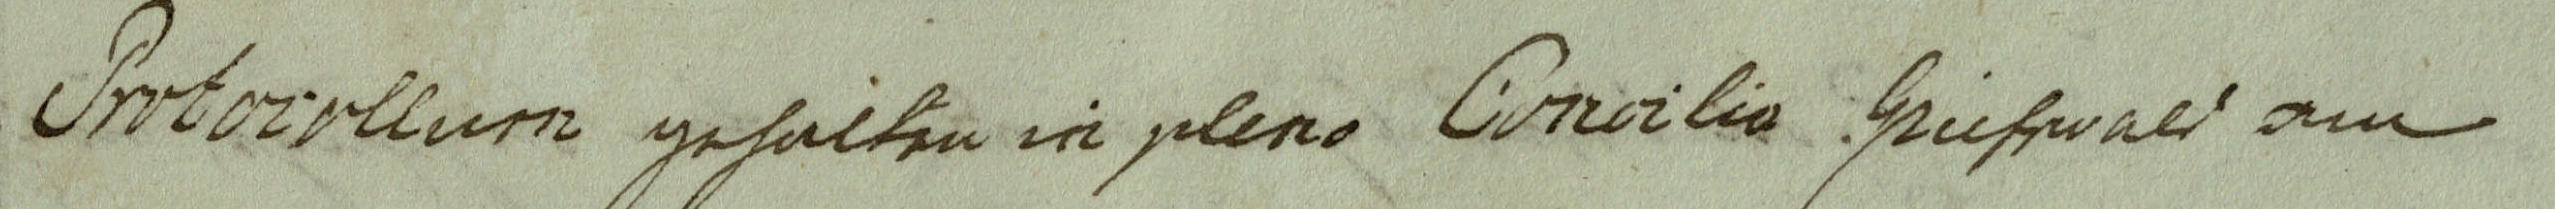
Protocollum gehalten in pleno Concilio. Greifswald am
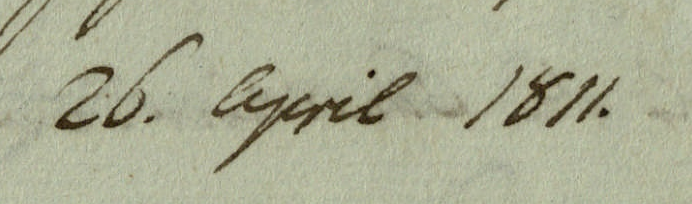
26. April 1811.
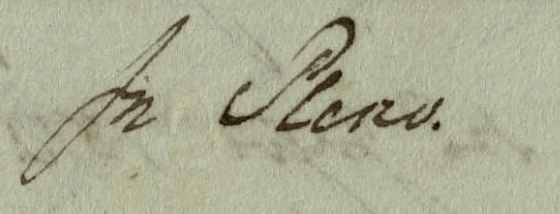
In Pleno.
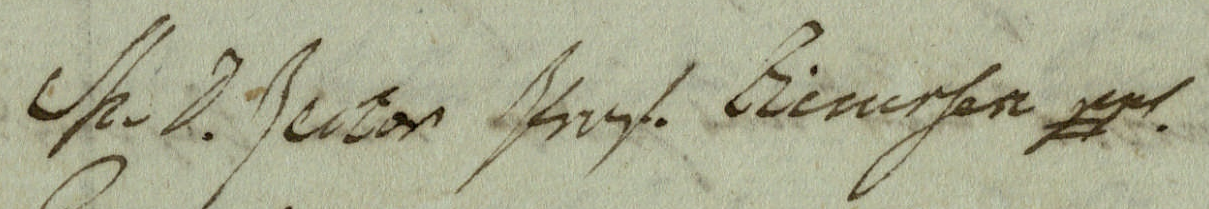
M. D. Rector Prof. Ziemssen ppt.
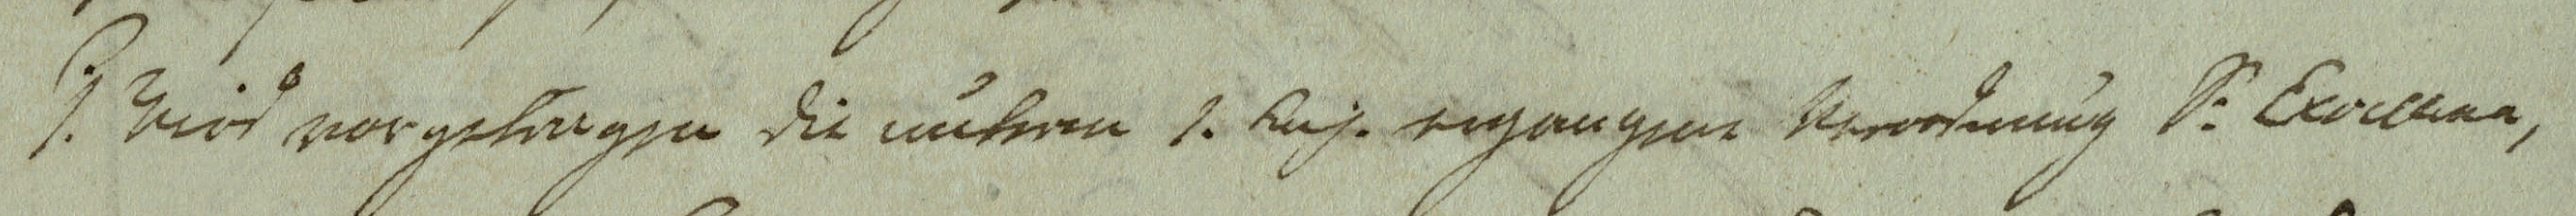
1. Wird vorgetragen die unterm 1. huj. eingegangene Verordnung Sr. Excellence,
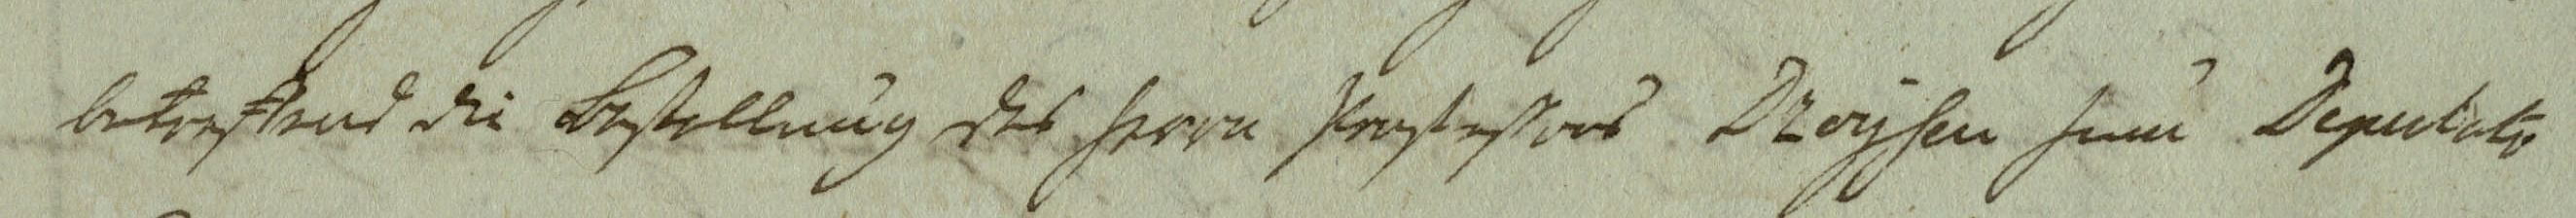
betreffend die Bestellung des Herrn Professors Droÿsen zum Deputato
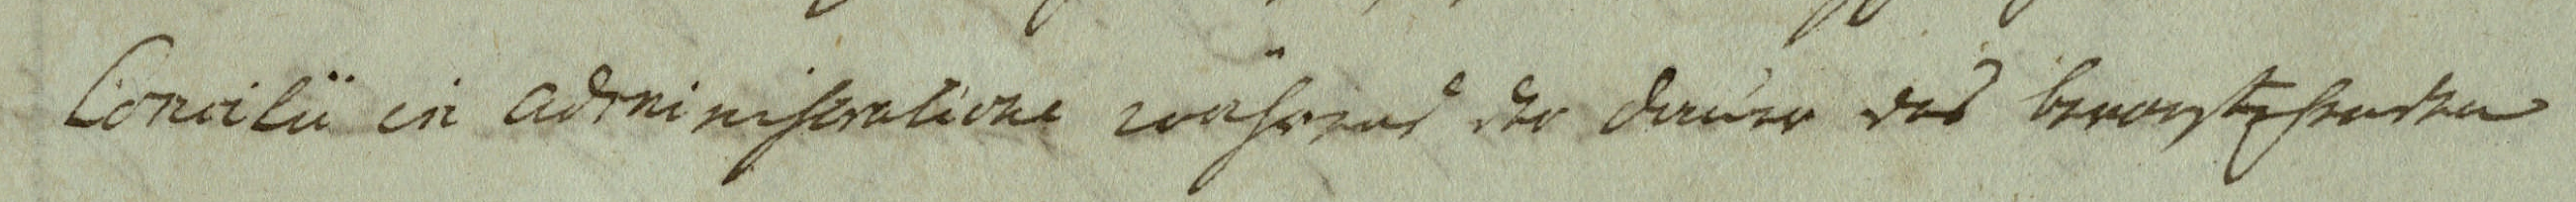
Concilii in Administratione während der Dauer des bevorstehenden
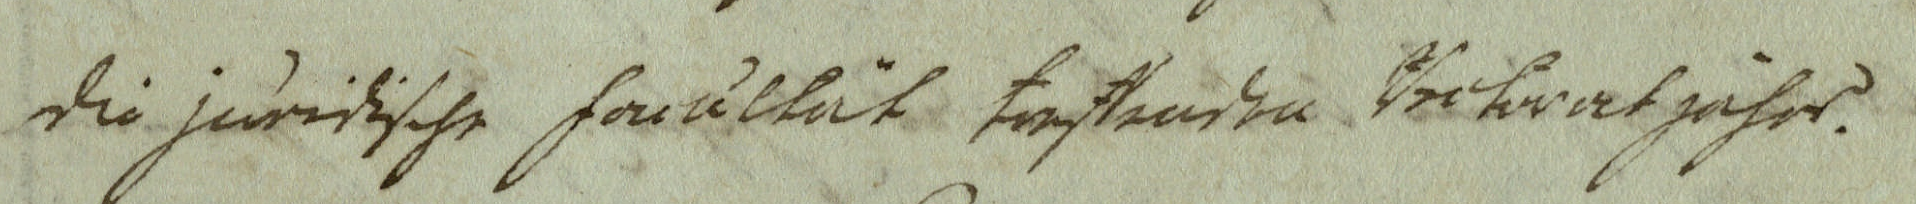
die juridische Facultät betreffenden Rectoratjahrs.
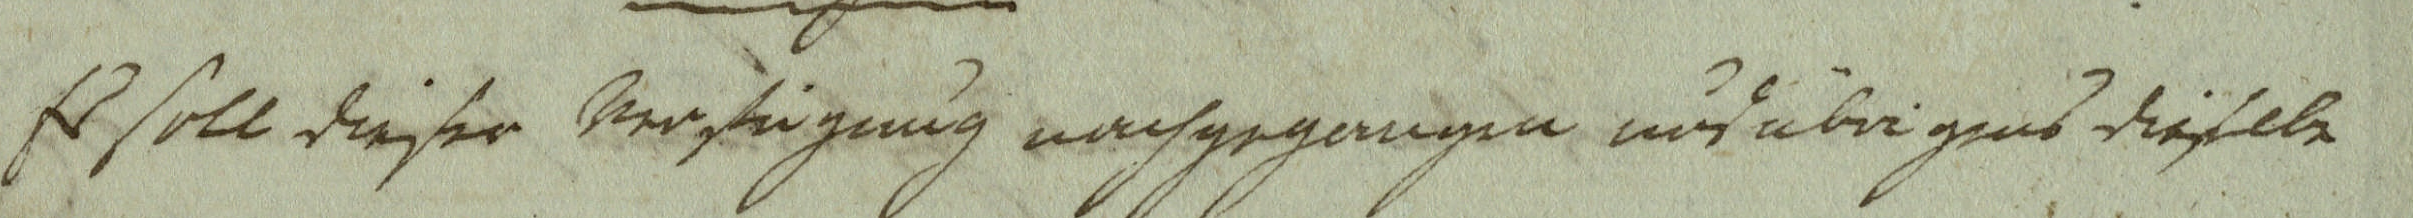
Es soll dieser Verfügung nachgegangen und übrigens dieselbe
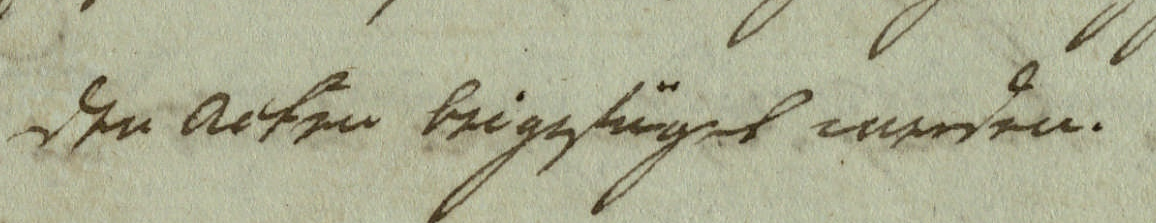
den Acten beigefüget werden.
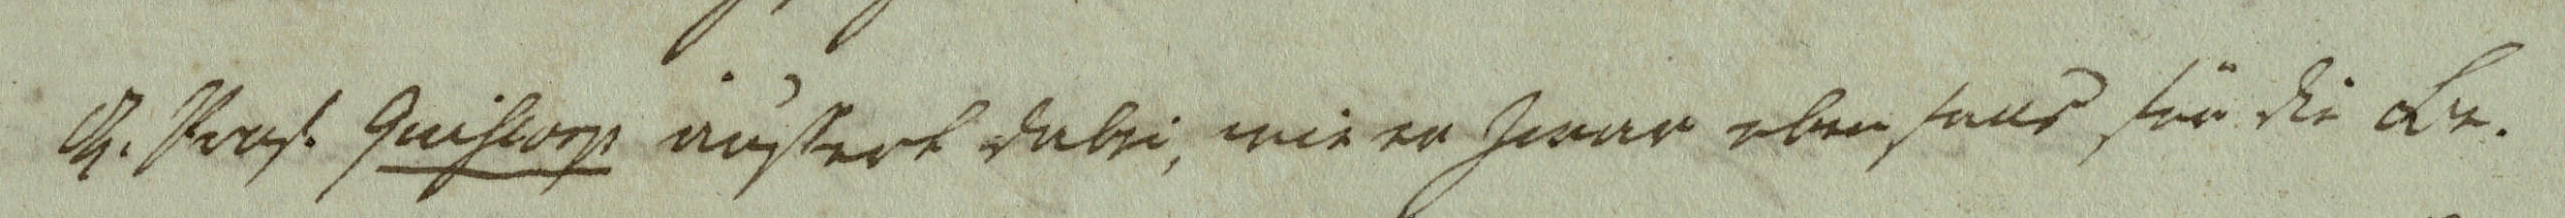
dh. Prof. Quistorp äussert dabei, wie er zwar ebenfalls für die Be¬
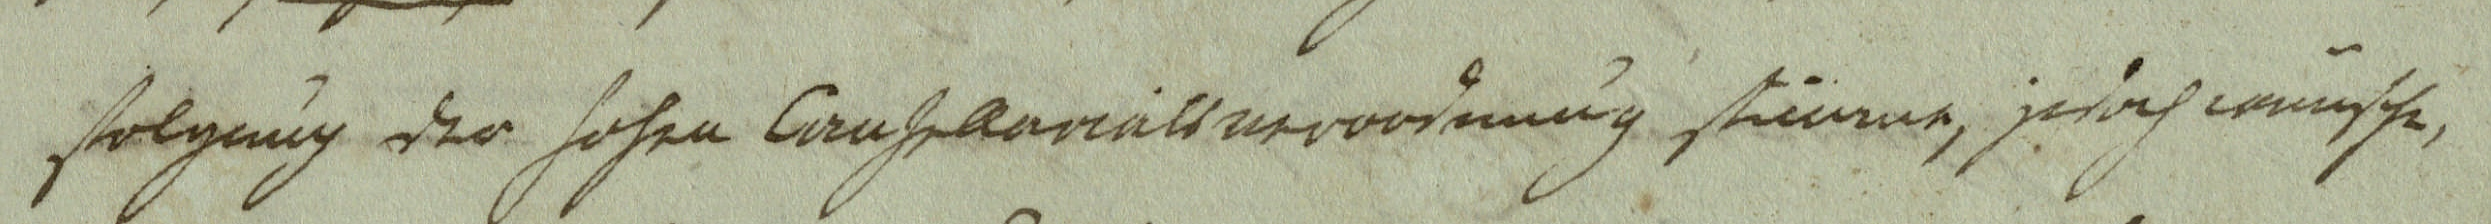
folgung der hohen Canzellariatsverordnung stimme, jedoch wünsche,
